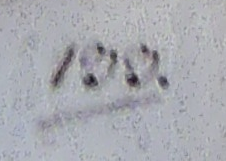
133.
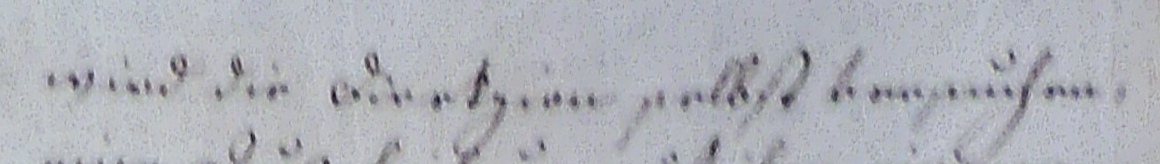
wird die Direkzion selbst versuchen,
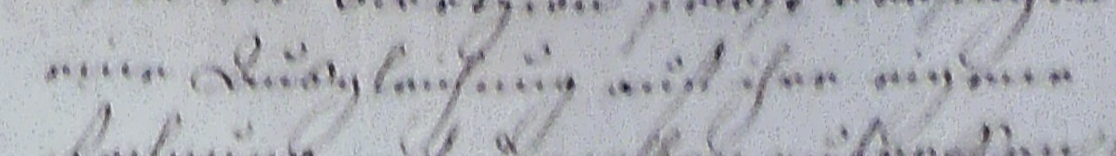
eine, Ausgleichung auf ihre eigene
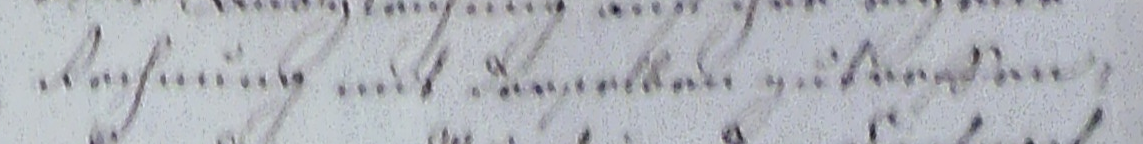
Rechnung mit derselben zutreffen
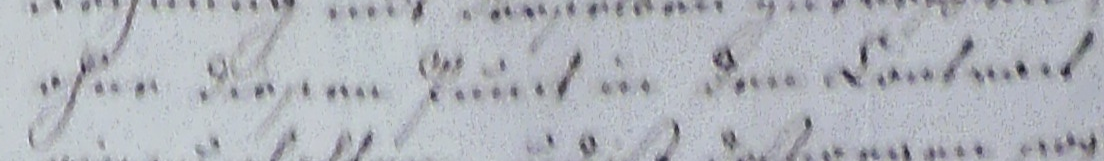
ohne diesen Punct in den Contract
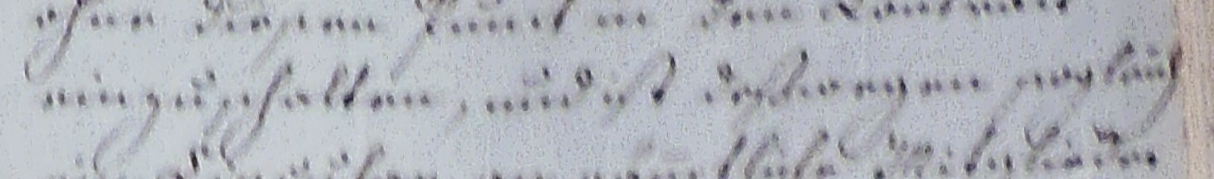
einzuschalten, und ist deßwegen zugleich
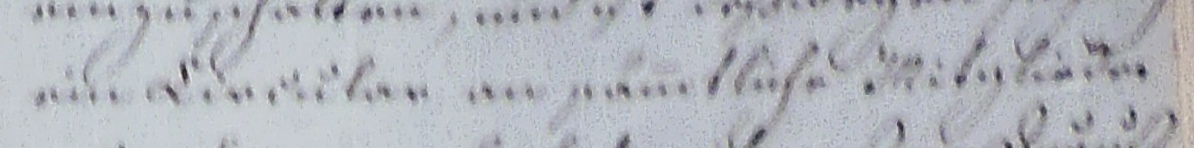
ein Circular an säm̅tliche Mitglieder
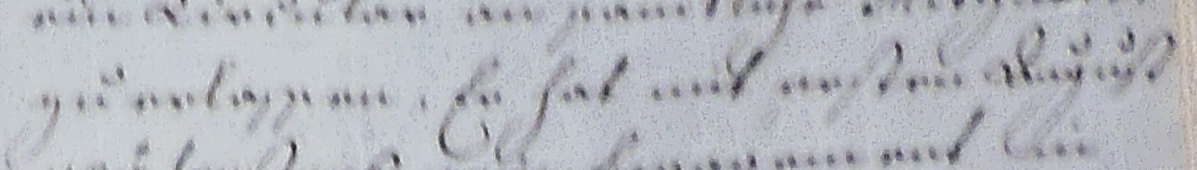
zu erlassen. Er hat mit ersten August
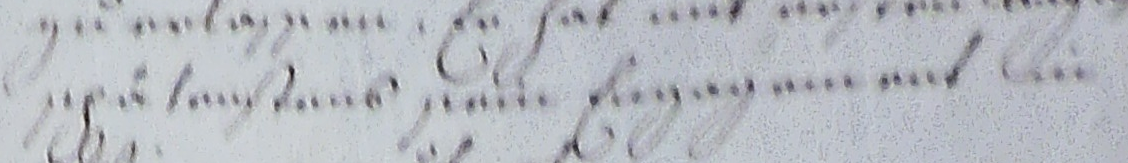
spätenstens sein Engagement in
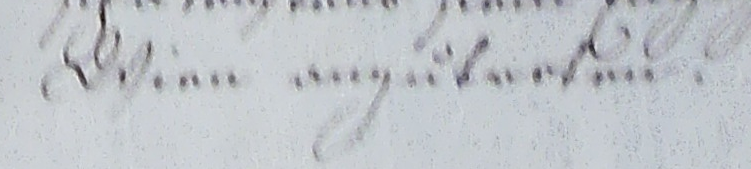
Wien anzutreten.
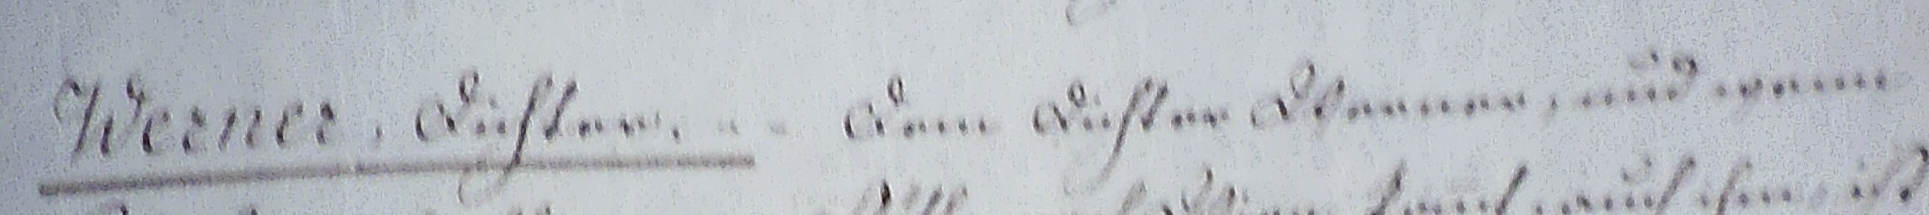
Werner, Dichter. .. .. Dem Dichter Werner, und wenn
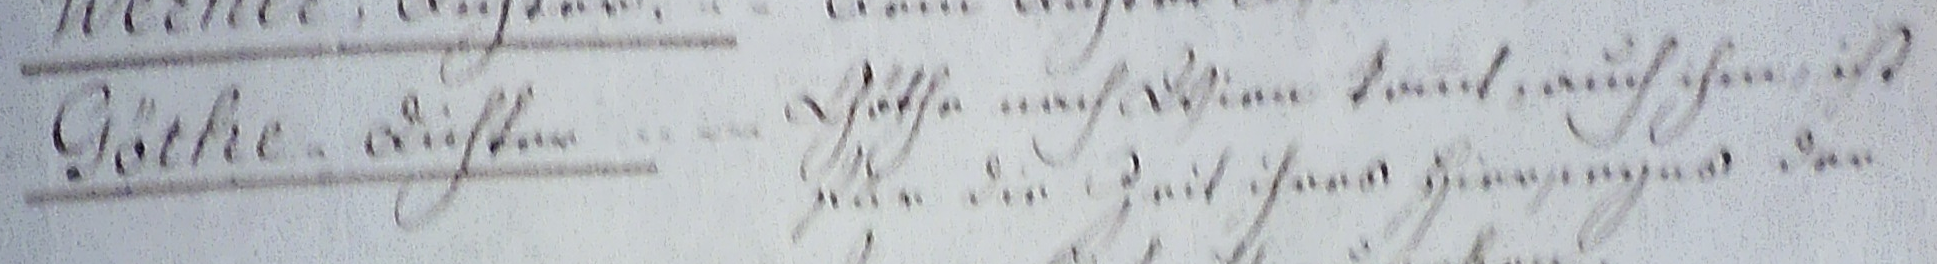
Göthe. Dichter. Göthe nach Wien kom̅t, auf ihn ist
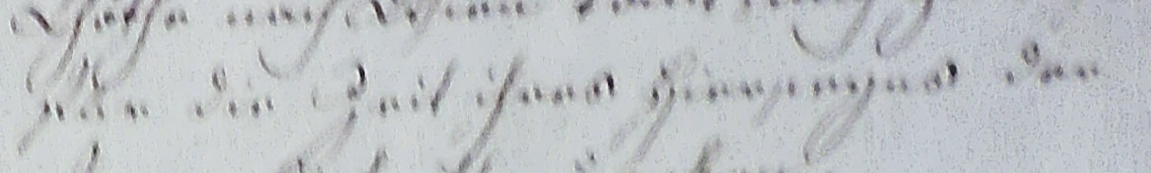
für die Zeit ihres Hierseyns der
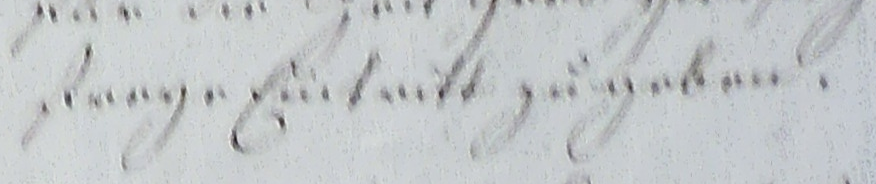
freye Eintritt zugeben.
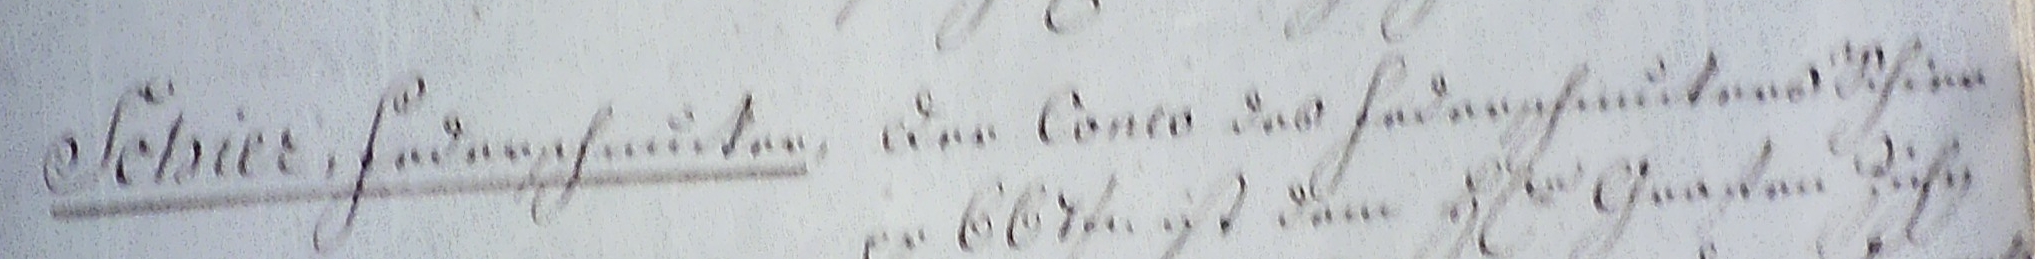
Schier, Federschmucker. Der Coneo des Federschmuckers Schier,
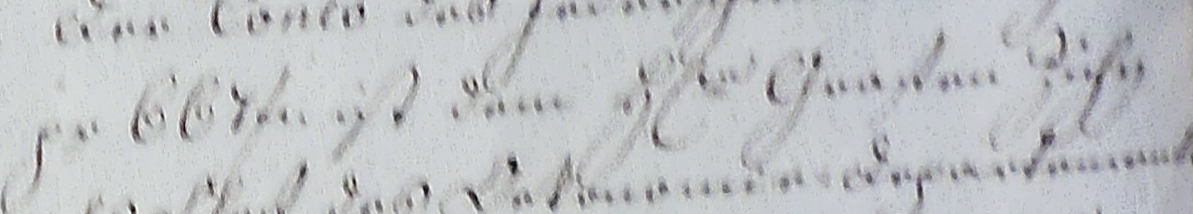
pr͇ 667fr. ist dem HEr͇n Grafen Zichy
